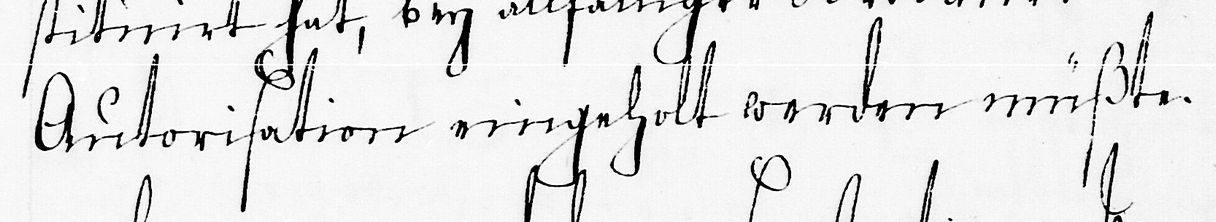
Autorisation eingeholt werden müßte.
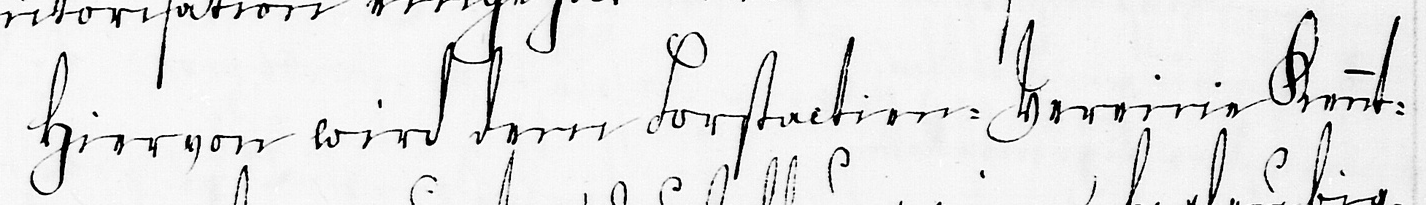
Hiervon wird dem Forstactien-Vereine Kenn¬
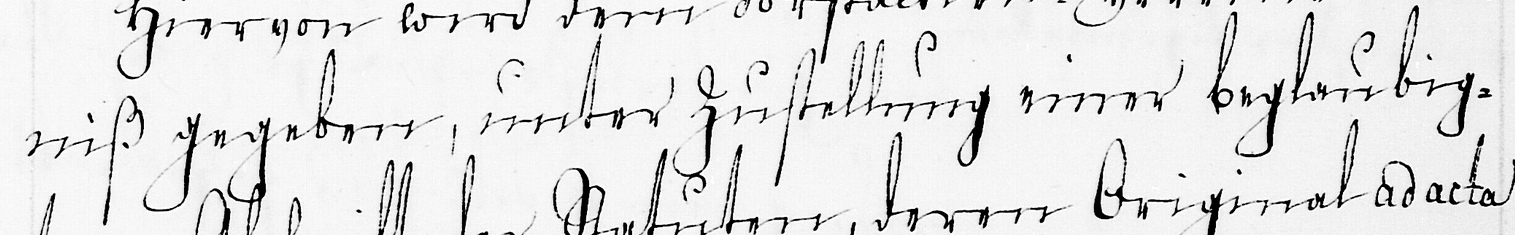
tniß gegeben, unter Zustellung einer beglaubig¬
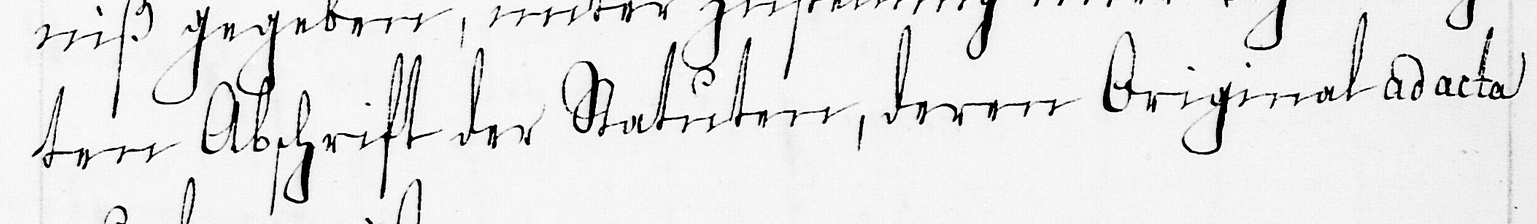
ten Abschrift der Statuten, deren Original ad acta
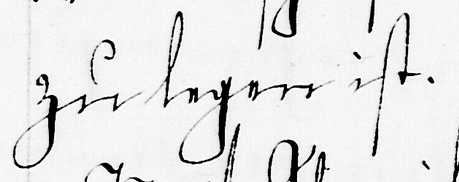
zu legen ist.
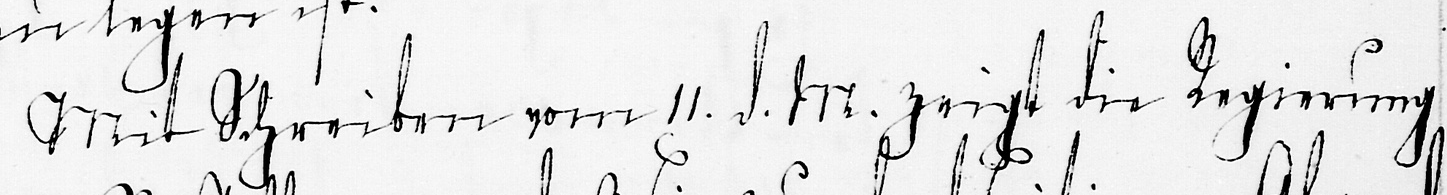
Mit Schreiben vom 11. d. M. zeigt die Regierung
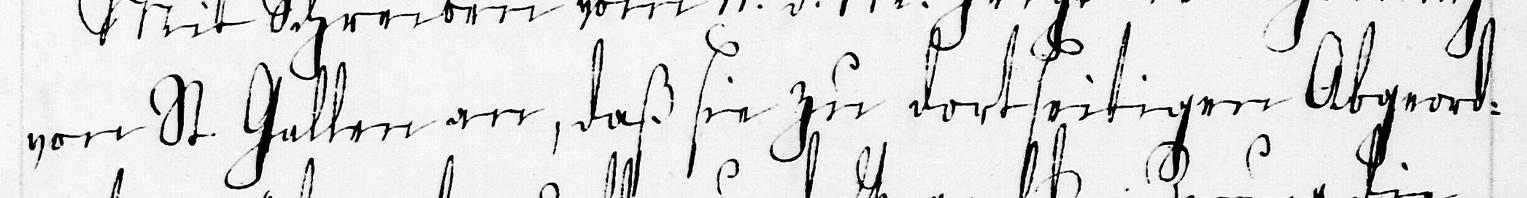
von St. Gallen an, daß sie zu dortseitigen Abgeord¬
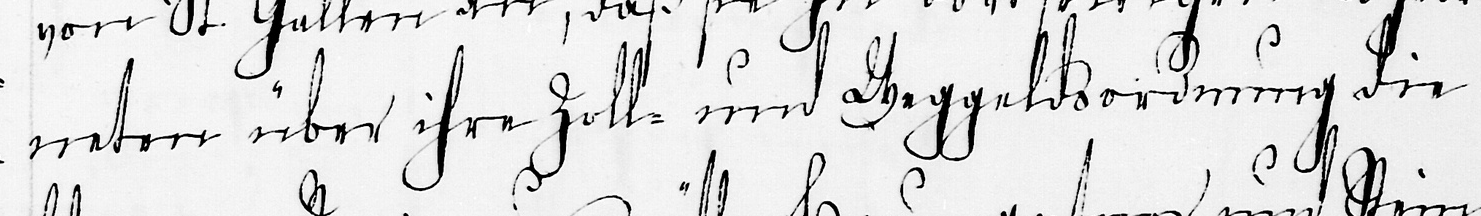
neten über ihre Zoll- und Weggeldsordnung die
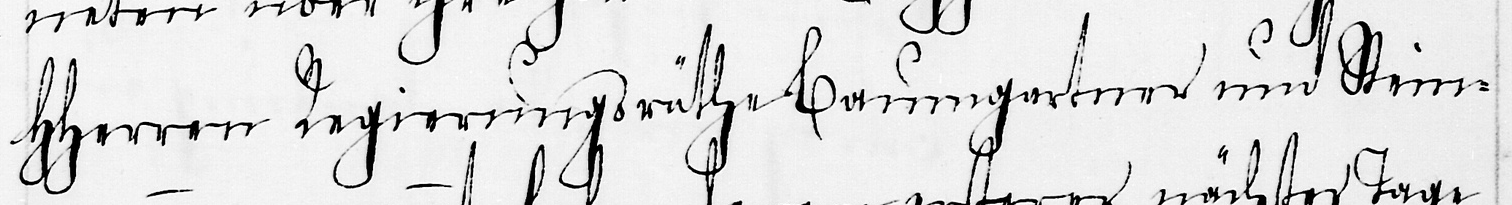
HHerren Regierungsräthe Baumgartner und Stein¬
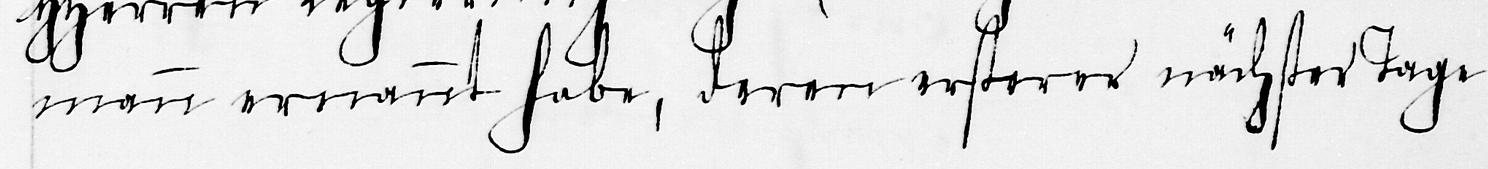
mann ernannt habe, deren ersterer nächster Tage
